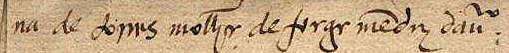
na de torres mol̄hr de Jorge m̄edez dauro
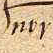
Sn̄or
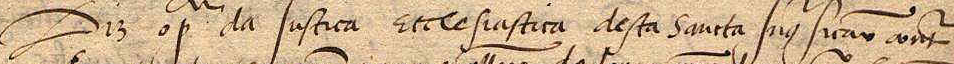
Diz o ptor da Justica Ecclesiastica desta Santa Jnq̄sicão cont̄
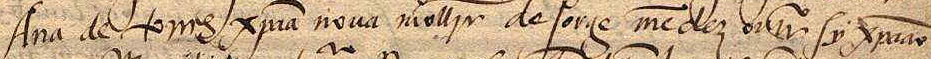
Ana de torres Xpāa noua mōlhr de Jorge m̄edez outosy Xpaão
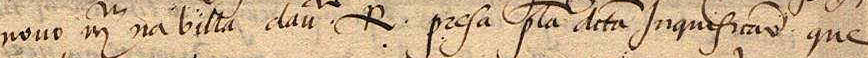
nouo mor na vilaa dauro .R. presa p̄la dc̄ta Jnquisição que
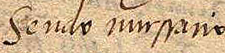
Sendo necessario
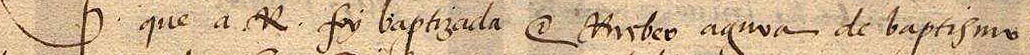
Pra. que a .R. foy baptizada e Recebeo aguoa de baptismo
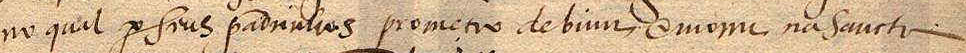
no qual ꝑ seus padrinhos prometeo de viuer e morrer na Sancta
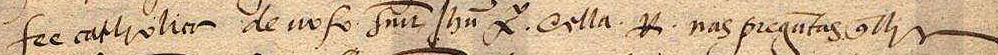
fee catholica de noso S̄nor Jhū Xo. e ella .R. nas pregūtas q̄ lhe
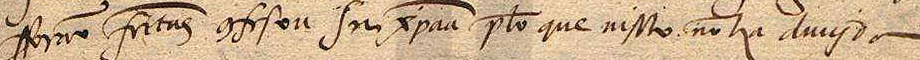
fforão fectas ꝯfesou ser xpāa p̄lo que nisso n̄o ha duujda
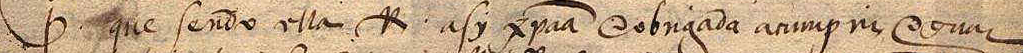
Pra. que sendo ella .R. asy xpāa e obrigada a cumprir e guar
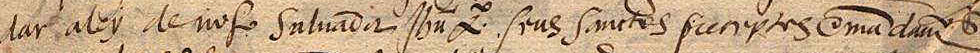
dar a ley de noso Saluador Jhū Xo. seus Sanctos preceptos e m̄adamtos.
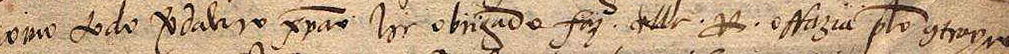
como todo ꝟdadeiro xpão he obrigado faz̄. ella .R. o ffazia p̄lo ꝯtrayro
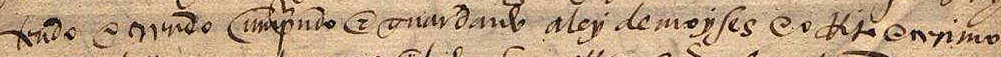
tendo e crendo Cump̄ndo e guardando a ley de moyses e o Rito e cerimo
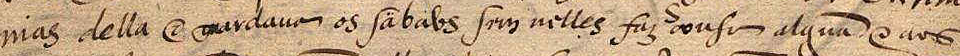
nias della e guardaua os sabados sem nelles faz̄ cousa algūa e aos
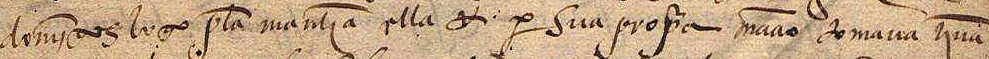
dom̄jgos p̄la manhā ella R. ꝑ Sua prop̄a maão tomaua h̄ua
